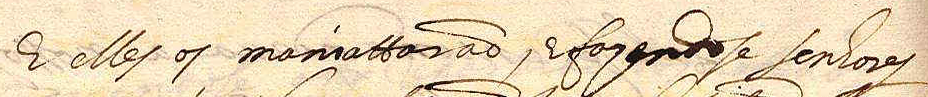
E elles os maniattarão, E fazendose senhores
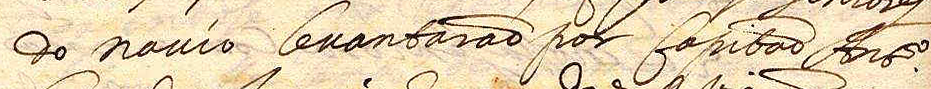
do nauio leuantarão por Capitão, Ant.o
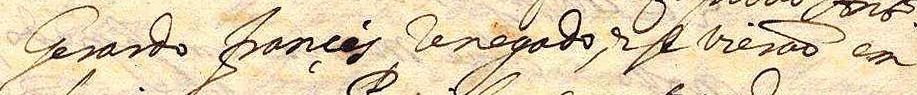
Gerardo frances Renegado, E se vierão em
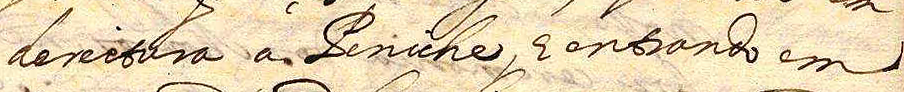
dereitura a Peniche, E entrando em
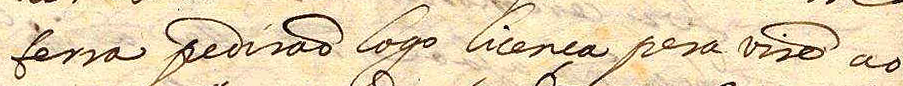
terra pedirão logo licença pera virē ao
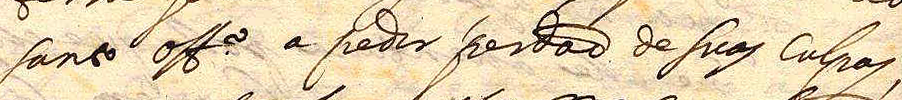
santo off.o a pedir perdaõ de suas culpas
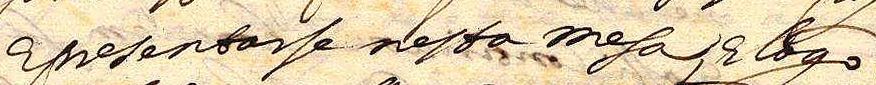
E presentarse nesta mesa E logo
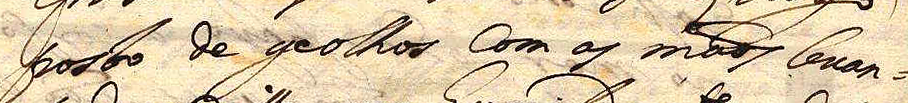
posto de geolhos com as mãos leuan
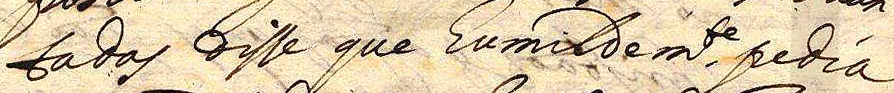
tadas disse que humildem.te pedia
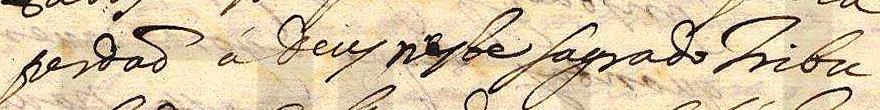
perdaõ a Deus neste sagrado Tribu
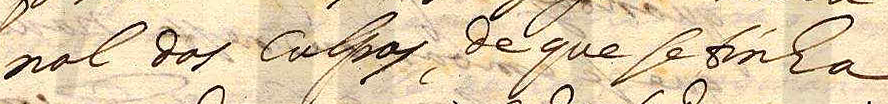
nal das culpas de que se tinha
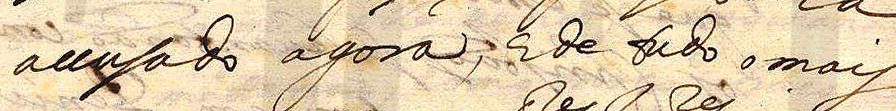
accusado agora, E de tudo o mais
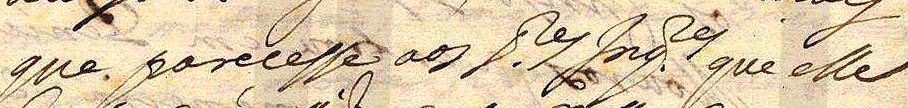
que parecesse aos s.res Jnq.res que elle
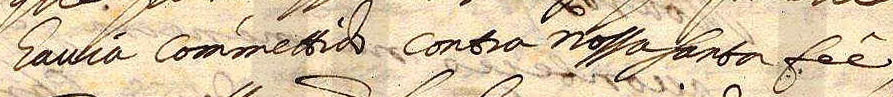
hauia commettido contra nossa santa feé
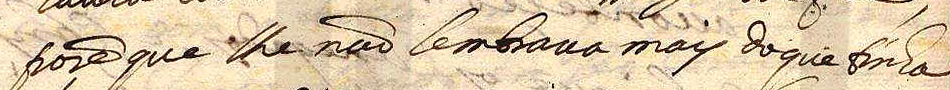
porē que lhe não lembraua mais do que tinha
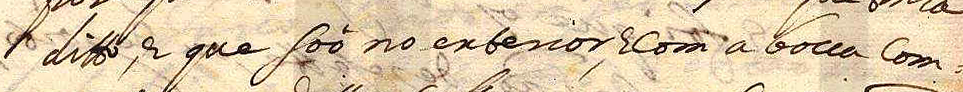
ditto, E que soó no exterior E com a bocca com
